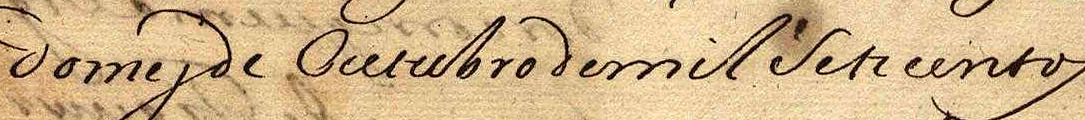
do mes de Outubro de mil Setecentos
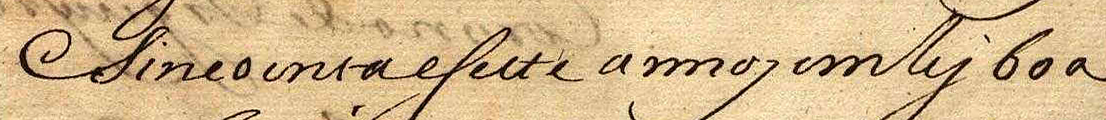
e Sincoenta e sette annos em lisboa
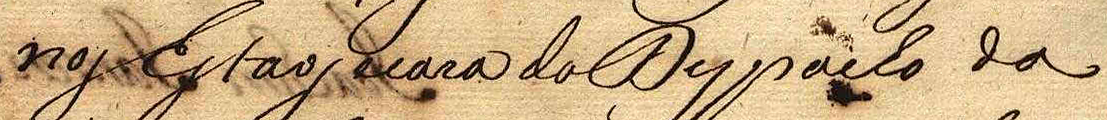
nos Estaos e caza do Despacho da
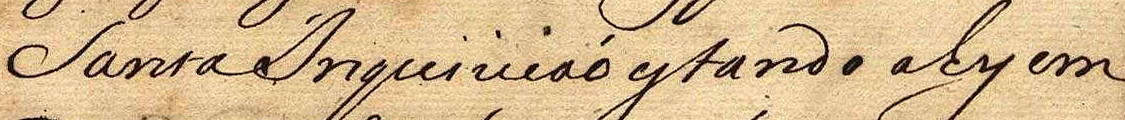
Santa Inquiziçaõ estando ahy em
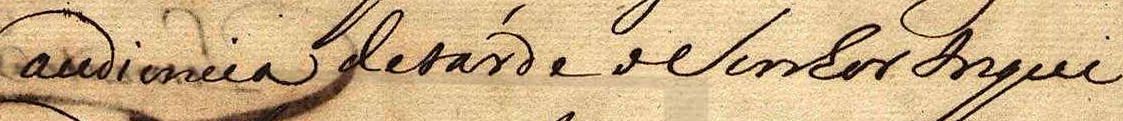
audiencia de tarde o Senhor Inqui
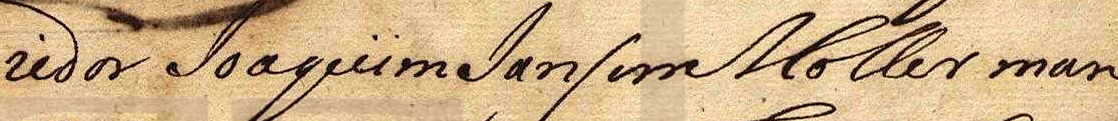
zidor Ioaquim Iansem Moller man
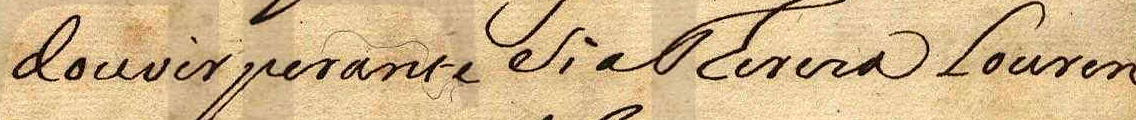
dou vir perante Si a Thereza Louren
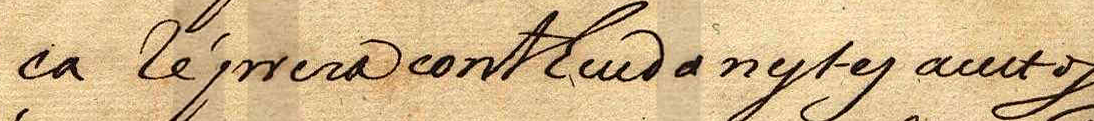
ça Ré preza contheuda nestes auttos
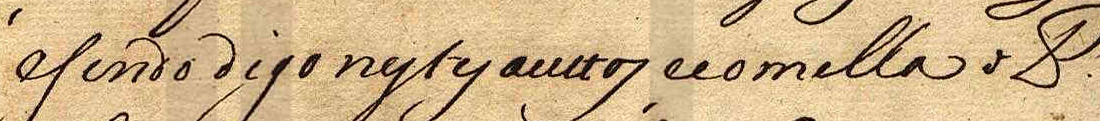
e sendo digo neste auttos e com ella o P.e
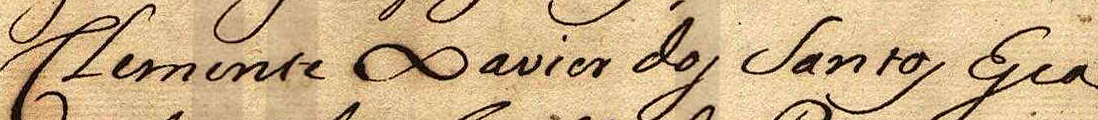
Clemente Xavier dos Santos Esca
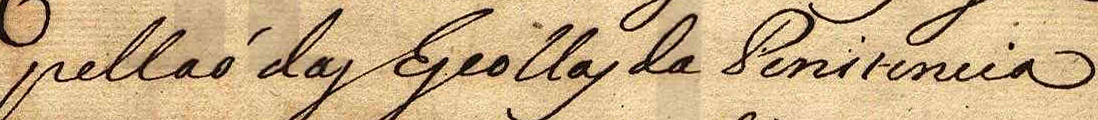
pellaõ das Escollas da Penitencia
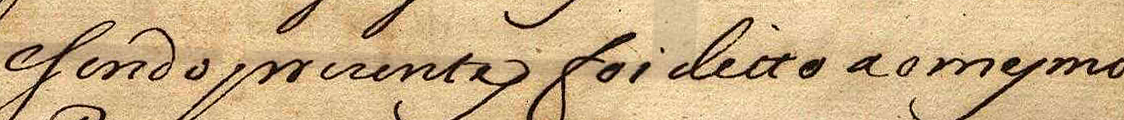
e sendo prezentes foi ditto ao mesmo
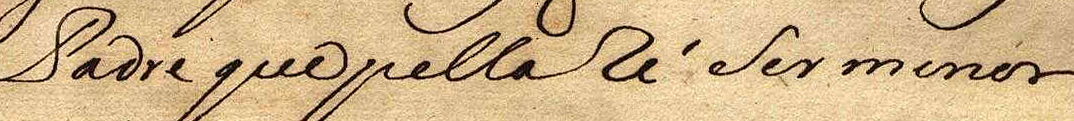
Padre que pella Ré Ser menor
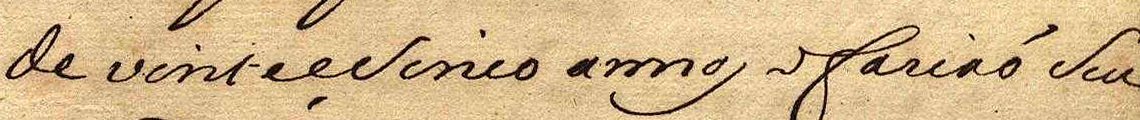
de vinte e sinco annos o faziaõ Seu
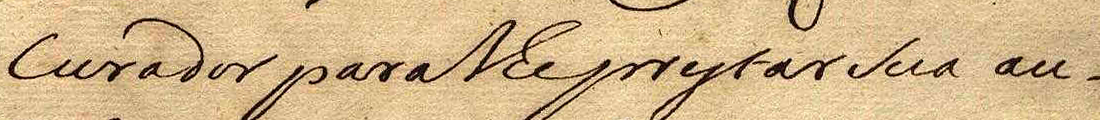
curador para lhe prestar Sua au
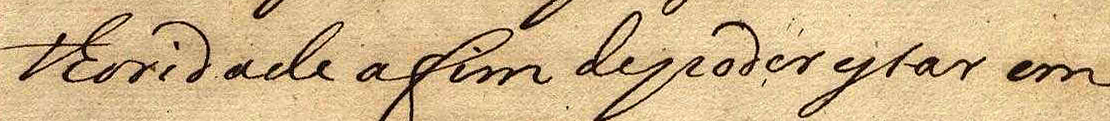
thoridade a fim de poder estar em
